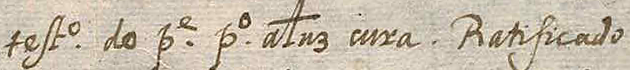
testo. do pe. po. al̄uz cura. Ratificado
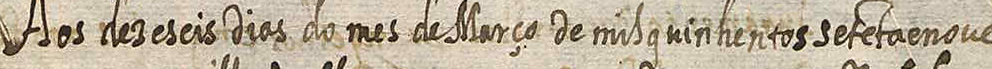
Aos dezeseis dias do mes de Março de mil quinhentos setēta e noue
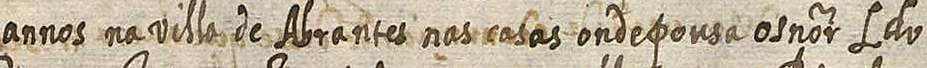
annos na villa de Abrantes nas casas onde pousa o snōr L.do
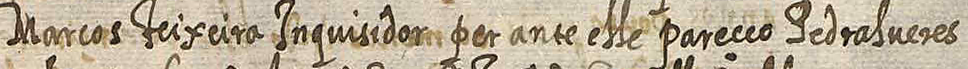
Marcos Teixeira Inquisidor perante elle pareçeo Pedralueres
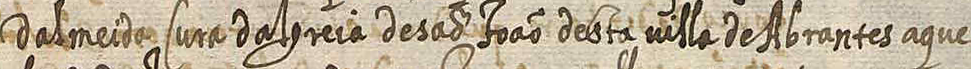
dalmeida Cura da Igreja de saõ Ioão desta villa de Abrantes a que
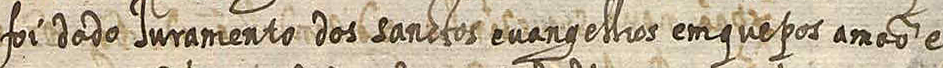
foi dado Iuramento dos sanctos euangelhos em que pos a maõ e
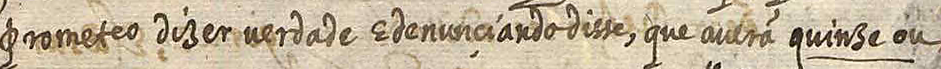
prometeo dizer uerdade E denunçiando disse, que auerá quinze ou
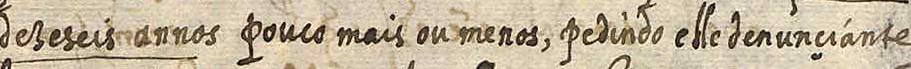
dezeseis annos pouco mais ou menos, pedindo elle denunçiante
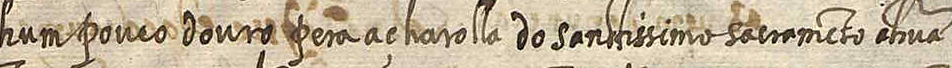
hum pouco douro pera a çharolla do sanctissimo sacramēto a huā
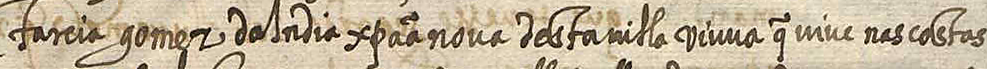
Tareia gomez da India xpaã noua desta villa viuua q̄ uiue nas costas
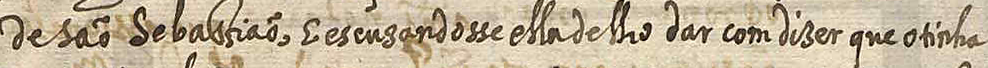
de são Sebastião, E escusandosse ella de lho dar com dizer que o tinha
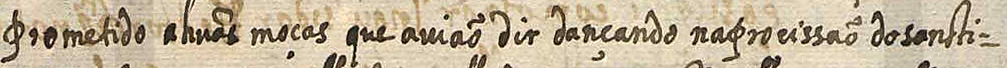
prometido a huās moças que auião dir dançando na procissaõ do sancti
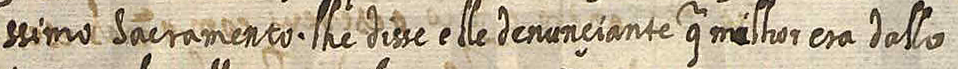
ssimo Sacramento. lhe disse elle denunçiante q̄ milhor era dallo
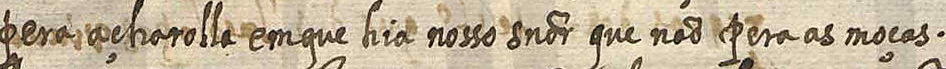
pera a çharolla em que hia nosso snōr que não pera as moças.
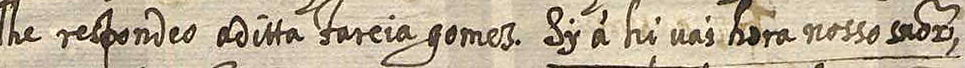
lhe respondeo a ditta Tareia gomez. Sy á hi uai hora nosso snōr,
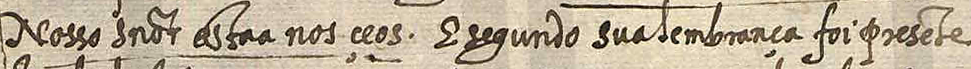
Nosso Snōr estaa nos çeos. E segundo sua lembrança foi presēte
